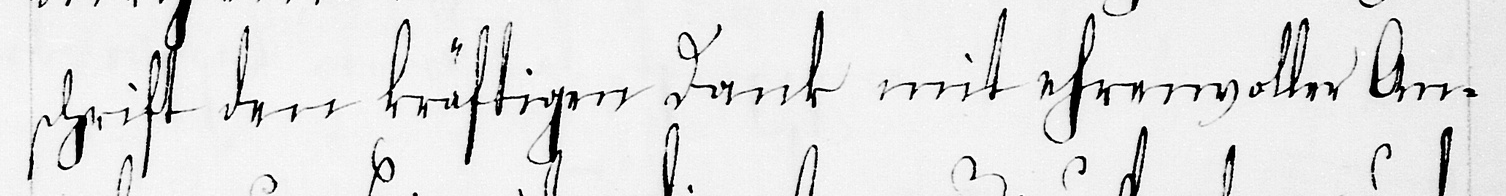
schrift den kräftigen Dank mit ehrenvoller An¬
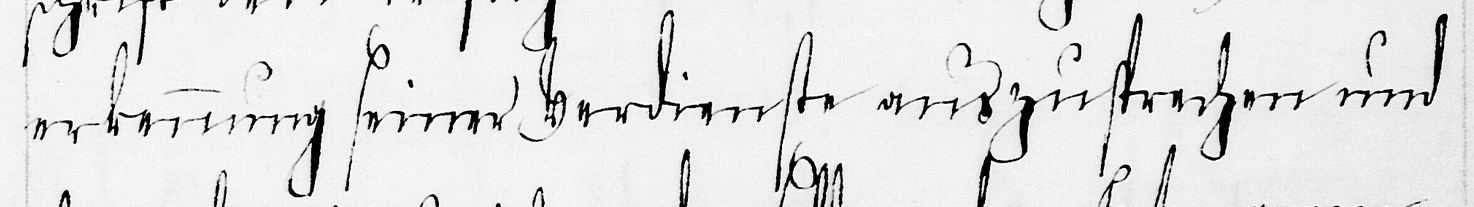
erkennung seiner Verdienste auszusprechen und
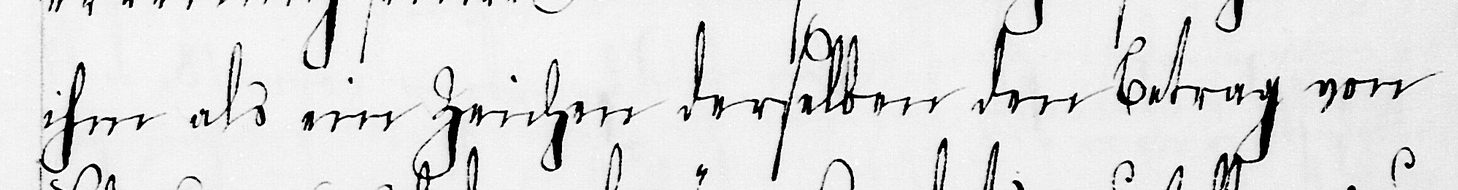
ihm als ein Zeichen derselben den Betrag von
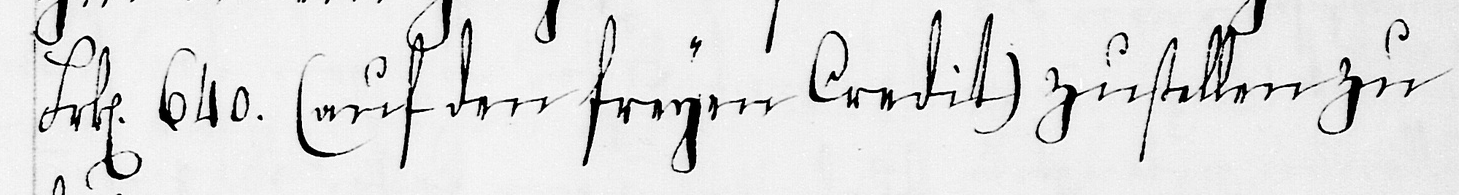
k[en]. 640. (auf den freyen Credit) zustellen zu
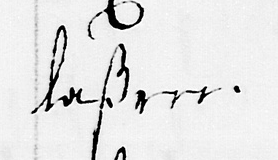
laßen.
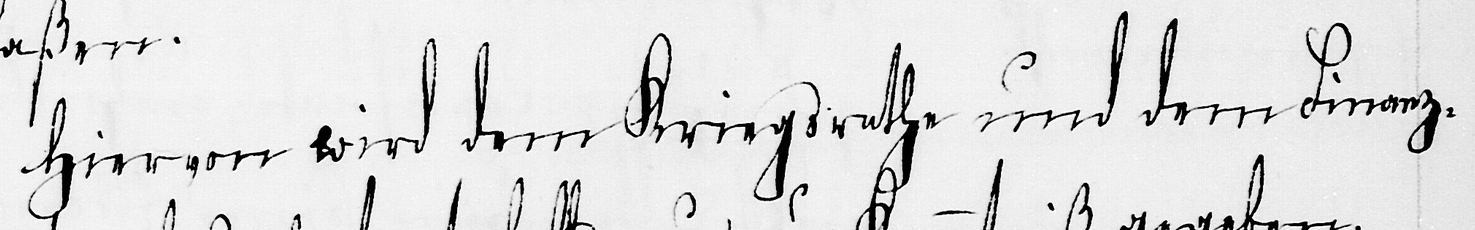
Hiervon wird dem Kriegsrathe und dem Finanz¬
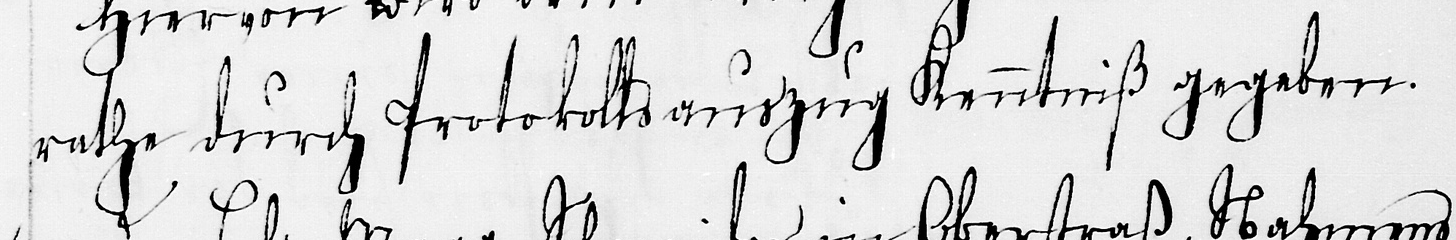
rathe durch Protokollsauszug Kenntniß gegeben.
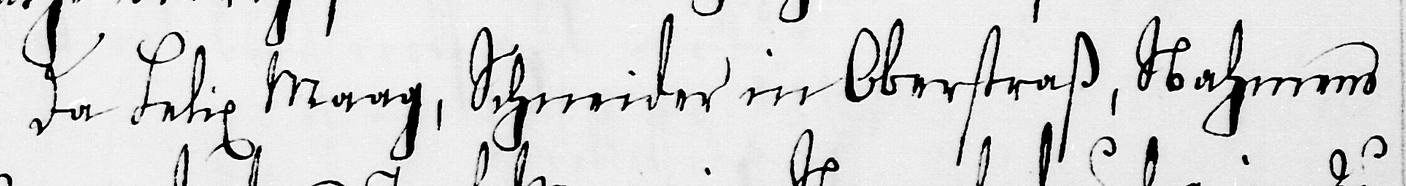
Da Felix Maag, Schneider in Oberstraß, Nahmens
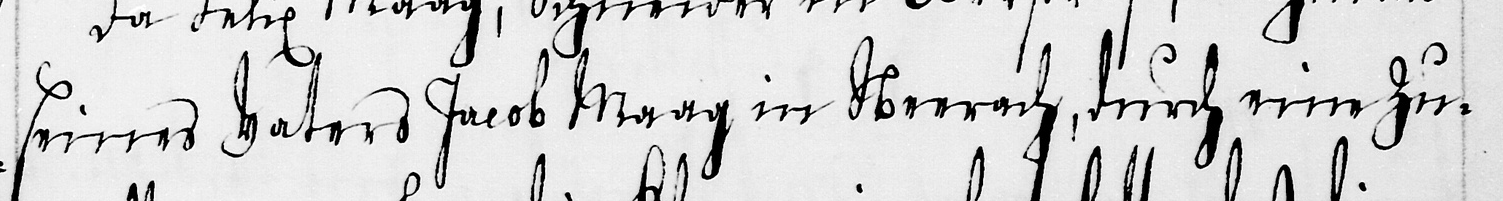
seines Vaters Jacob Maag in Neerach, durch eine Zus¬
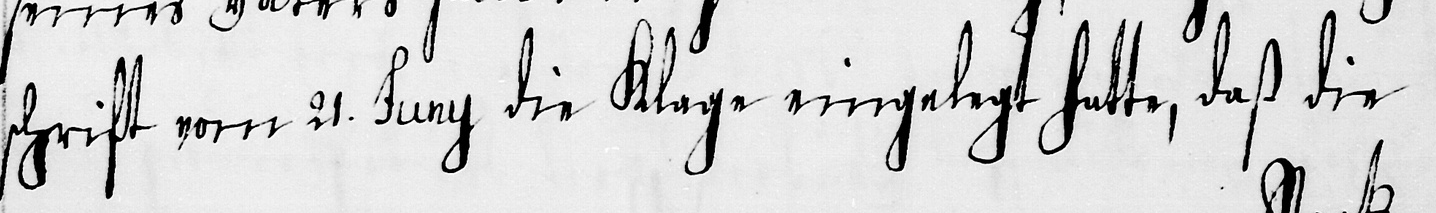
chrift vom 21. Juny die Klage eingelegt hatte, daß die
